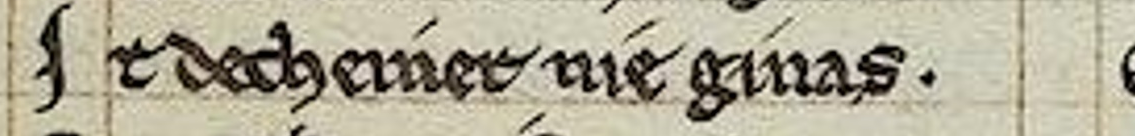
Ir decheiner nie ginas.
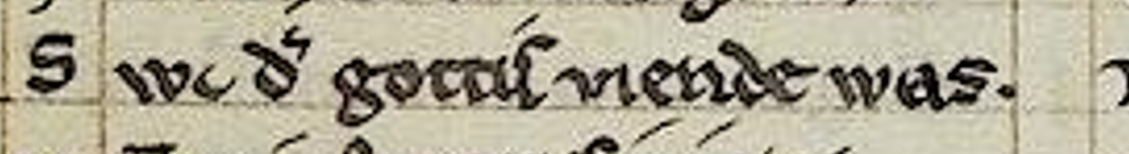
Sw(az) d(er) gottiſ viende was.
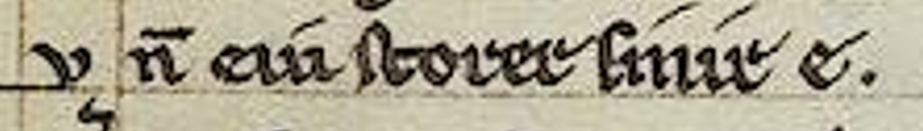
Vn(d) ein ſtorer ſinir e.
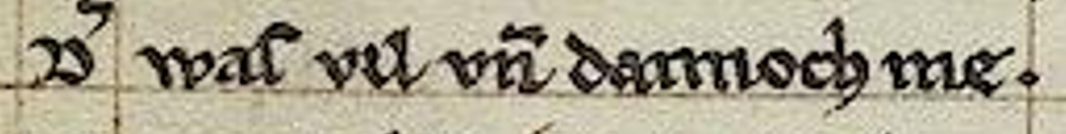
D(er) waſ vil vn(d) dannoch me.
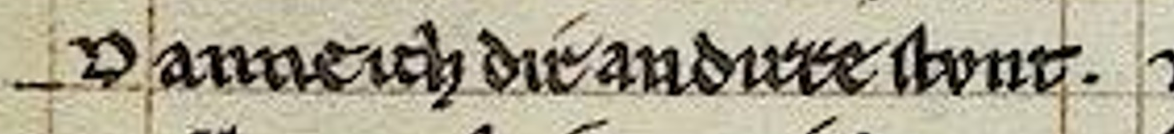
Danne ich dir an dirre ſtvnt.
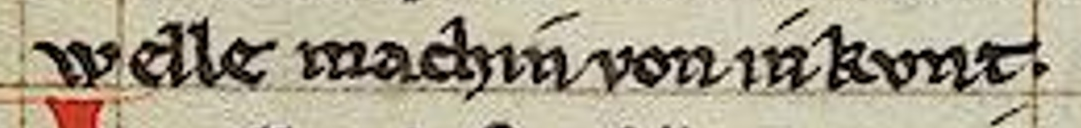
Welle machin von in kvnt.
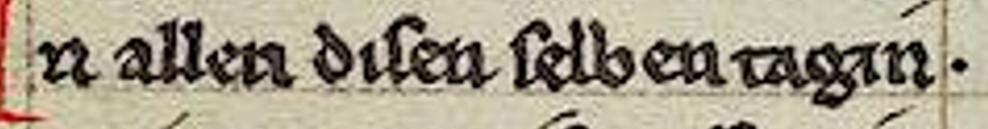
*In allen diſen ſelben tagin.
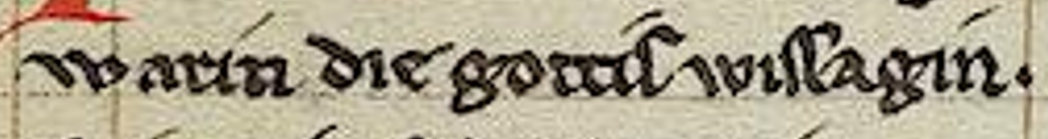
Warin die gottiſ wiſſagin.
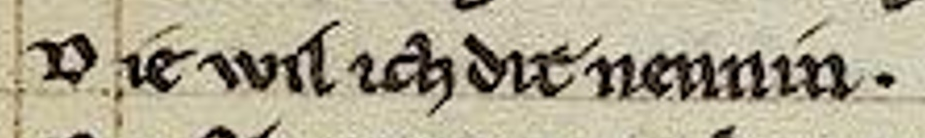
Die wil ich dir nennin.
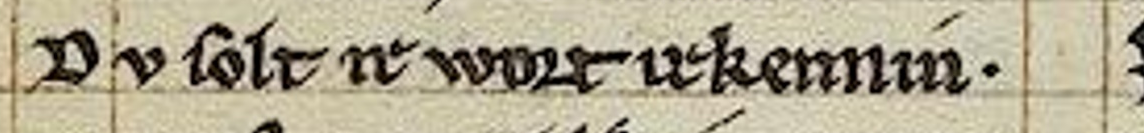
Dv ſolt ir wort irkennin.
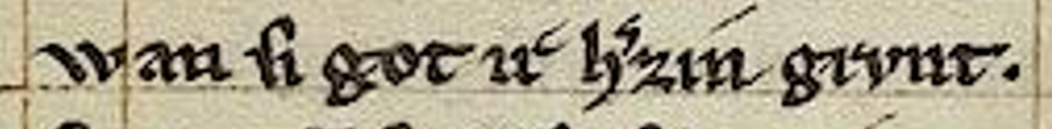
Wan ſi got ir h(er)zin grvnt.
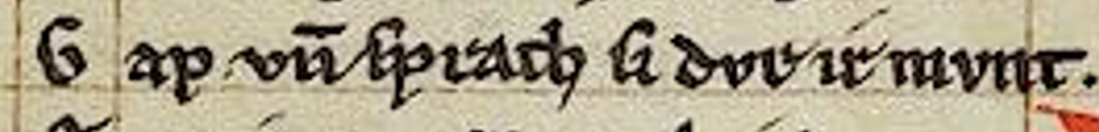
Gap vn(d) ſprach ſi dvr ir mvnt.
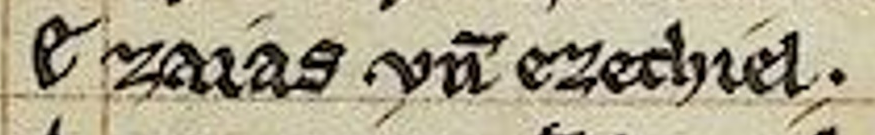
Ezaias. vn(d) ezechiel.
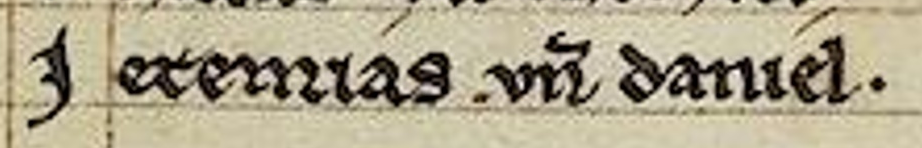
Ieremias. vn(d) daniel.
